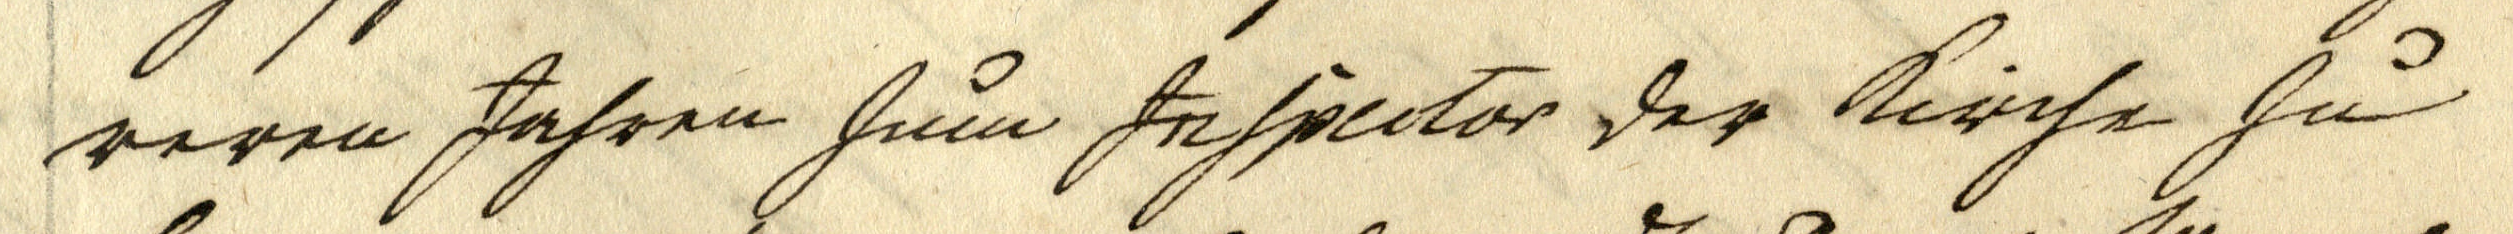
reren Jahren zum Inspector der Kriche zu
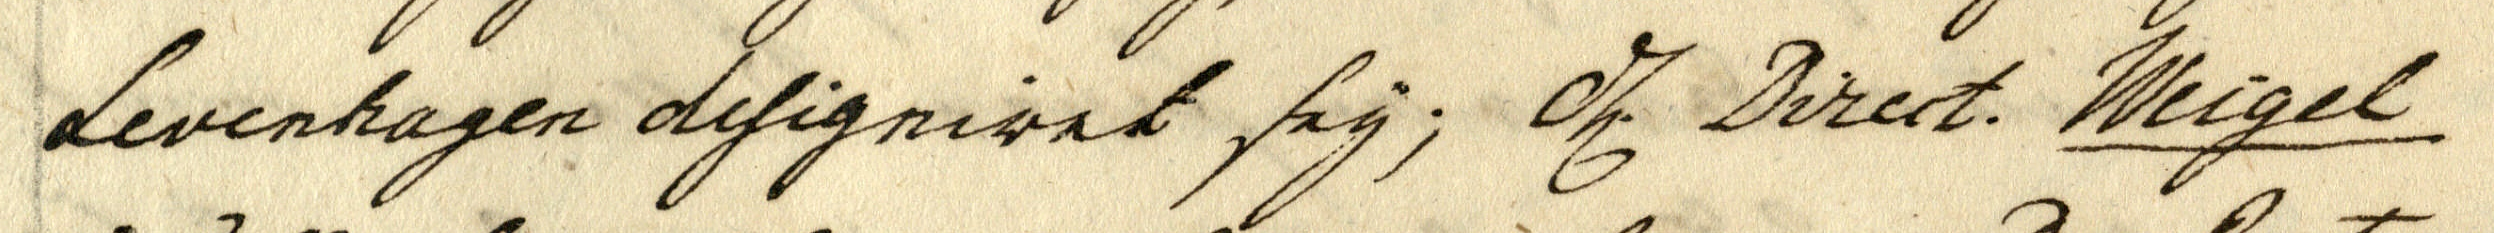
Levenhagen designiret sey; dh. Direct. Weigel
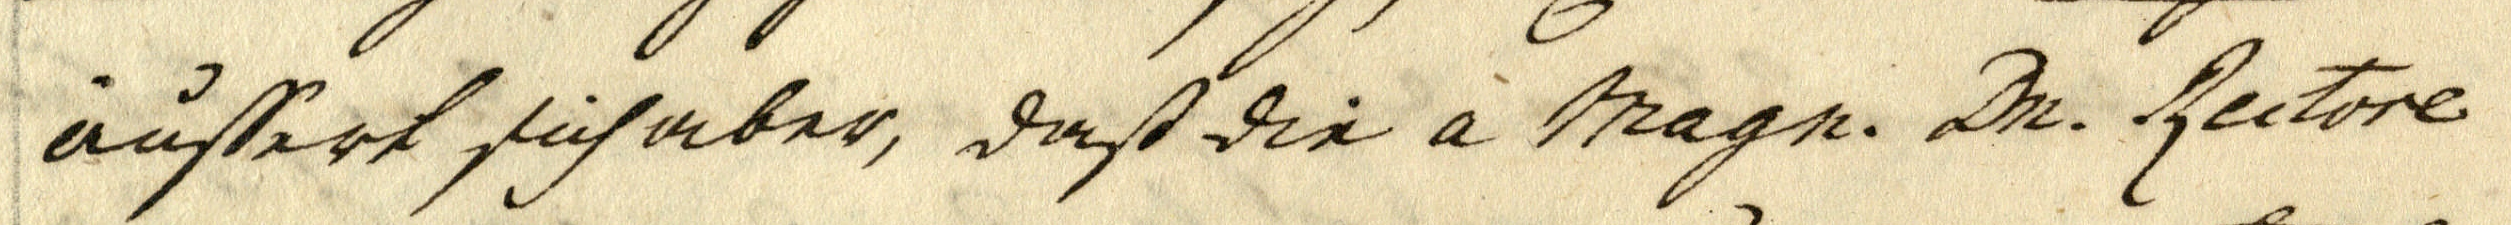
äussert sich aber, daß die a Magn. Dn. Rectore
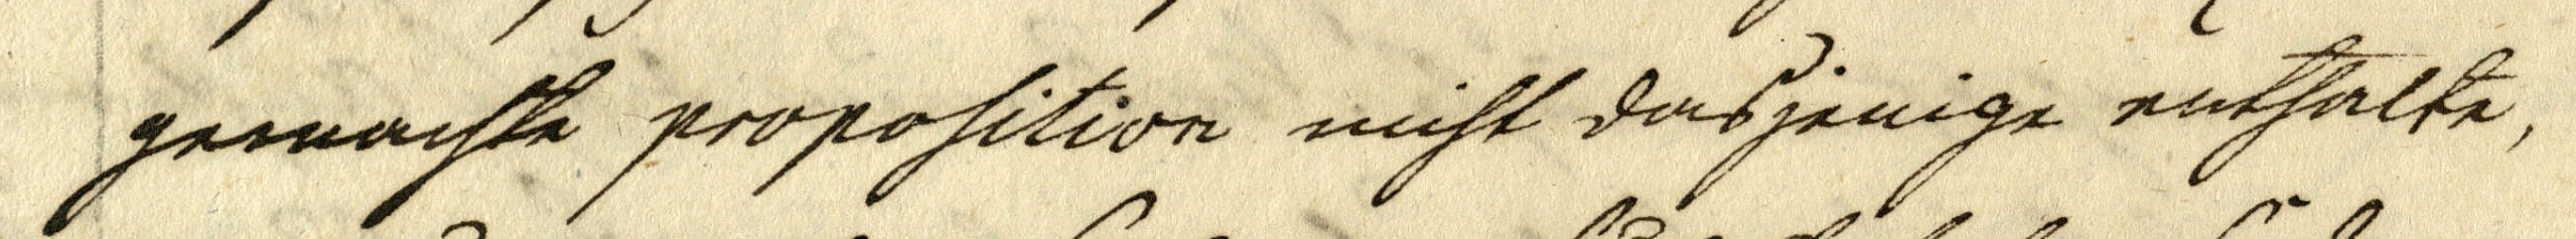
gemachte proposition nicht dasjenige enthalte,
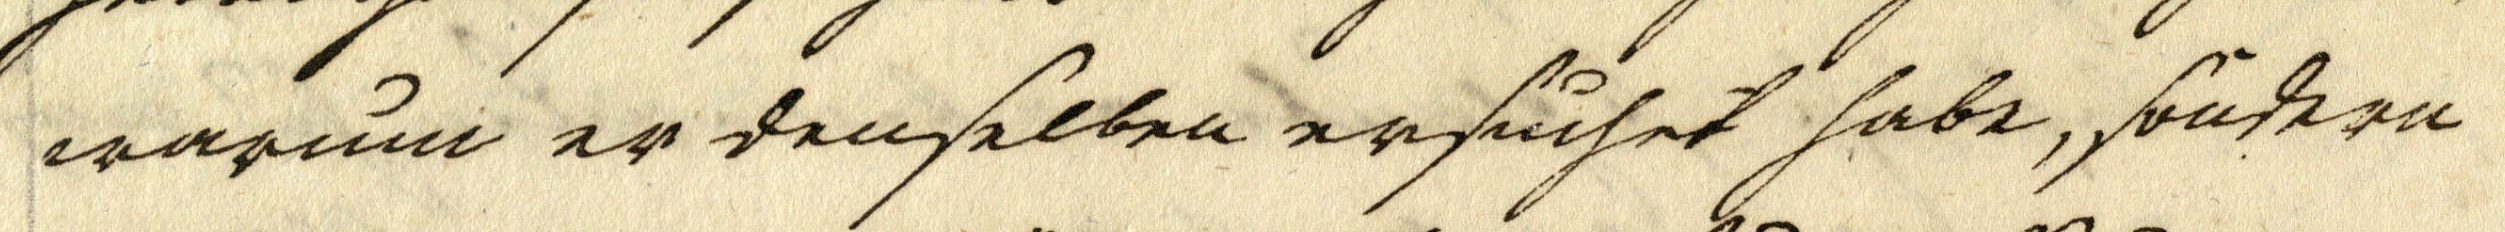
warum er denselben ersuchet habe, sondern
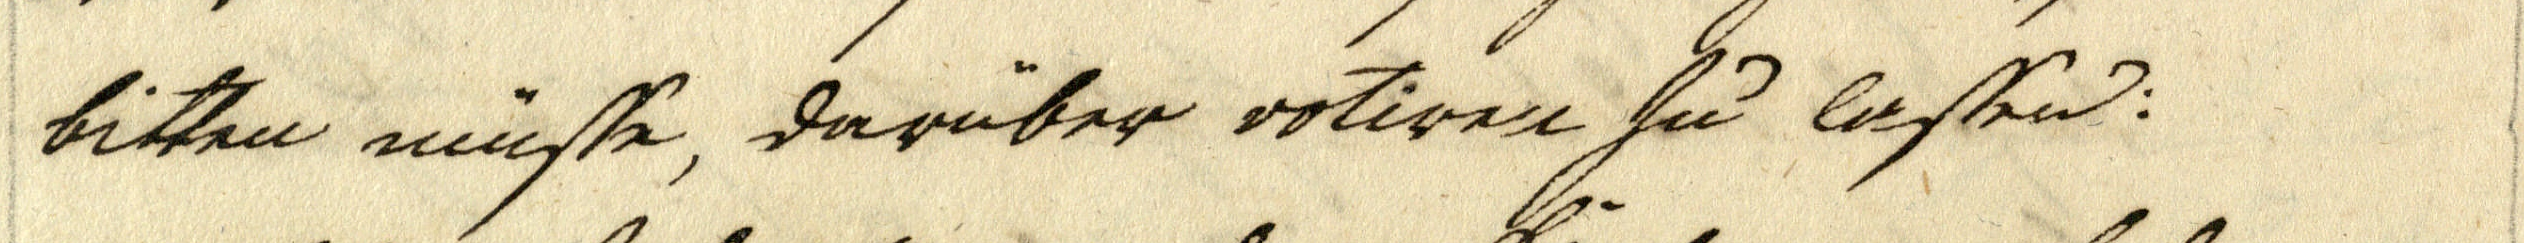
bitten müsse, darüber votiren zu lassen:
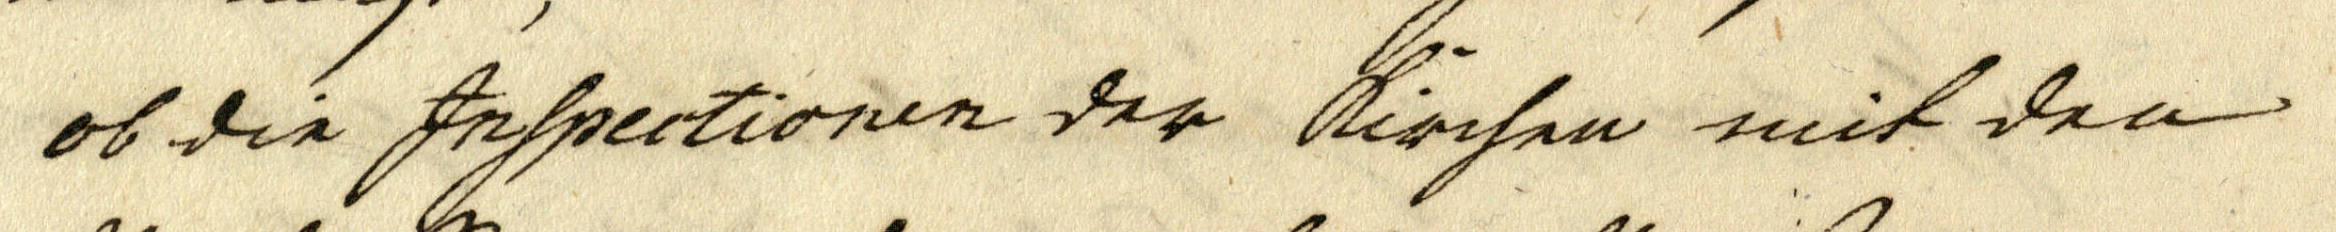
Ob die Inspectionen der Kirchen mit den
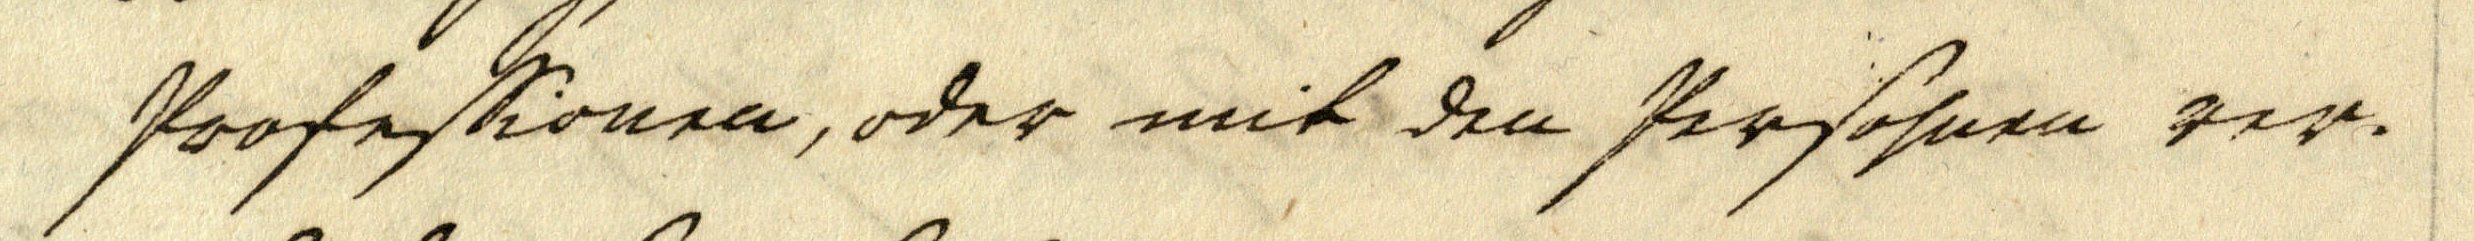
Professionen, oder mit den Persohnen ver-
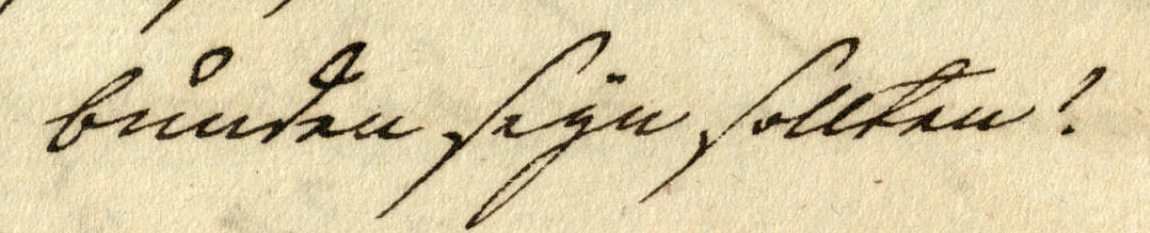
bunden seyn sollten?
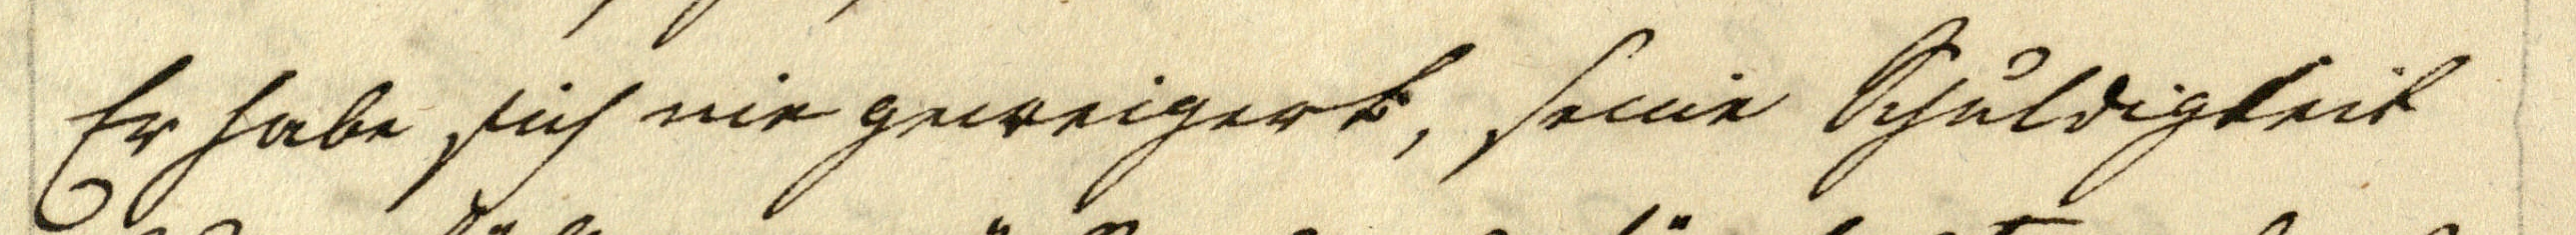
Er habe sich nie geweigert, seine Schuldigkeit
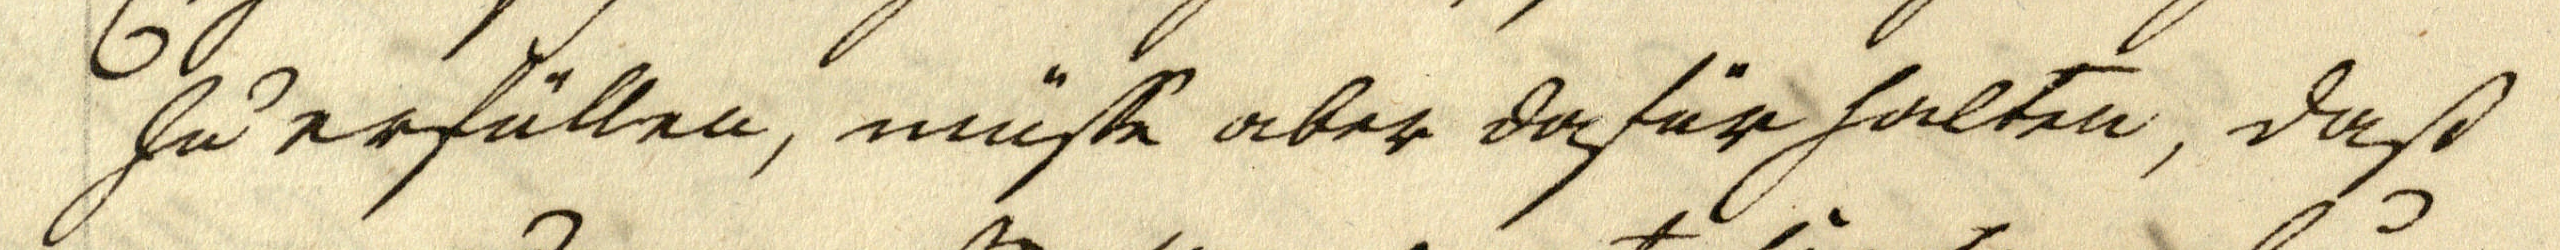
zu erfüllen, müsse aber dafür halten, daß
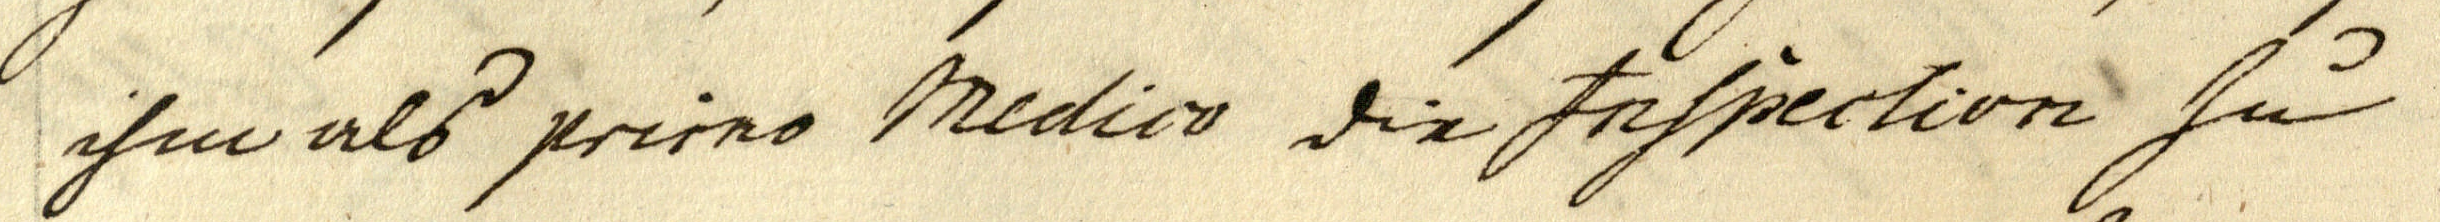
ihm als primo Medico die Inspection zu
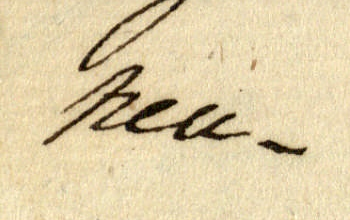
Neu-
